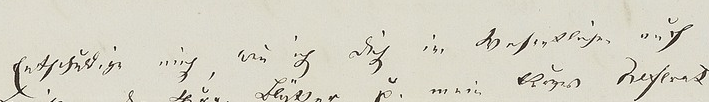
Entschuldige mich, wenn ich Dich im Wesentlichen auf
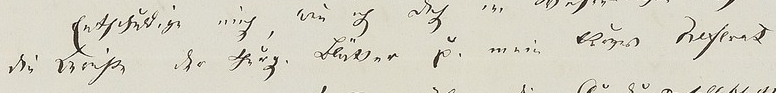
die Berichte der thurg. Blätter &. mein kurzes Referat
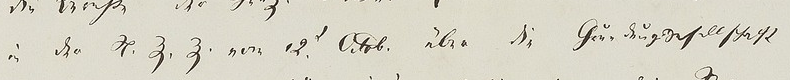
in der N.Z.Z. vom 12t Octob. über die Gründungsgesellschaft
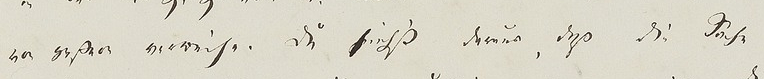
von gestern verweise. Du siehst daraus, daß die Sache
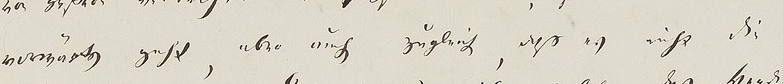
vorwärts geht, aber auch zugleich, daß es nicht die
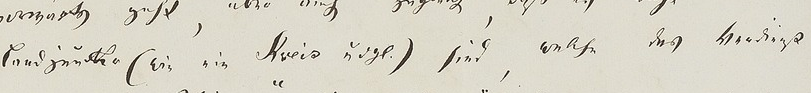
Landjunker (wie ein Kreis & dgl.) sind, welche das Verdienst
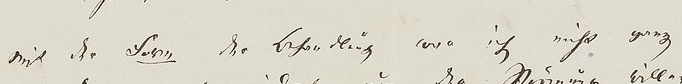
Mit der Form der Behandlung war ich nicht ganz
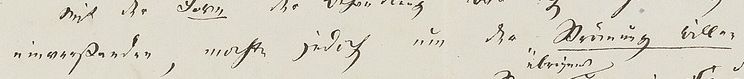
einverstanden, mochte jedoch um der Strömung willen
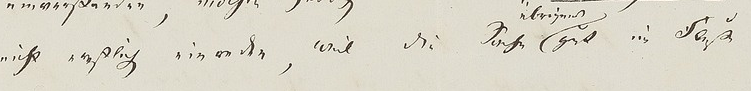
nicht ernstlich einreden, weil die Sache übrigens gut im Fluße
